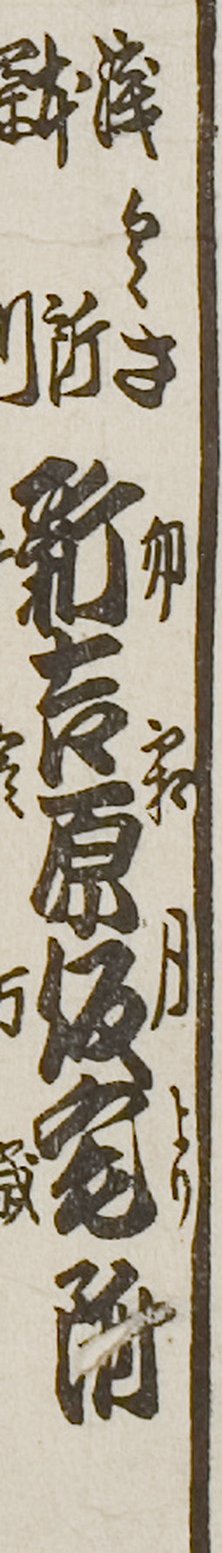本所新吉原仮宅附
